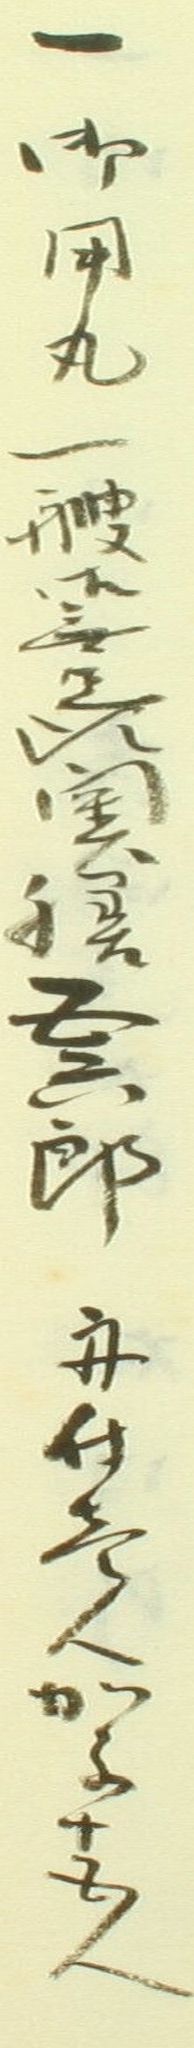一御用丸一艘御無足頭関積五六郎舟付壱人加子十五人
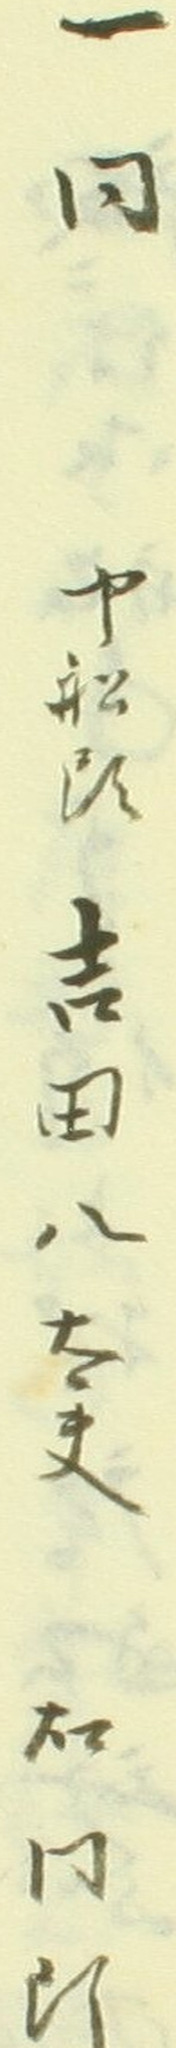一同中船頭吉田八大夫右同断
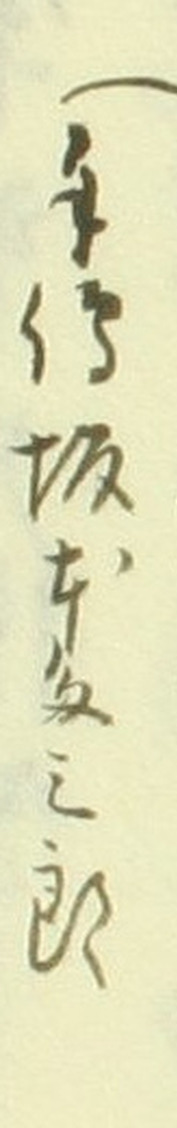手伝坂本籐三郎
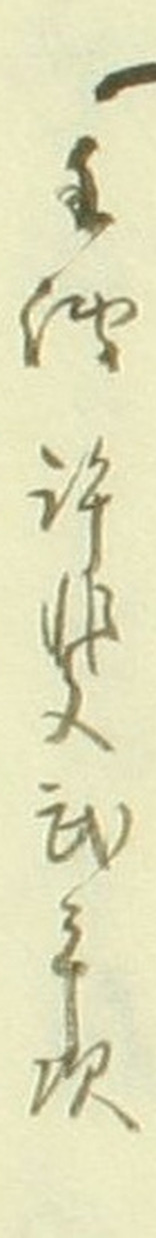手伝許斐武平次
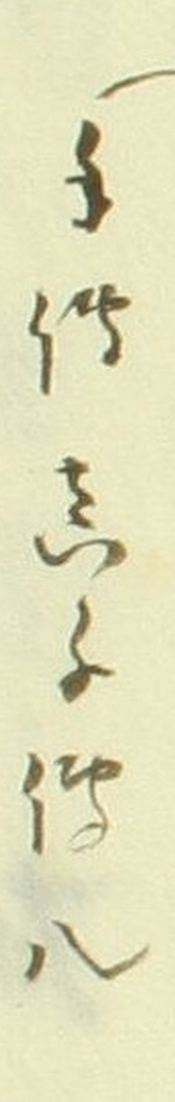手伝真子伝八
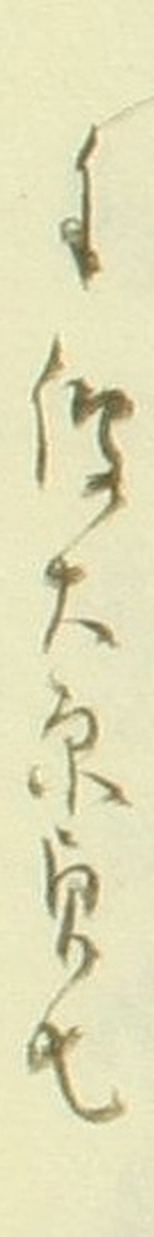手伝大原貞七
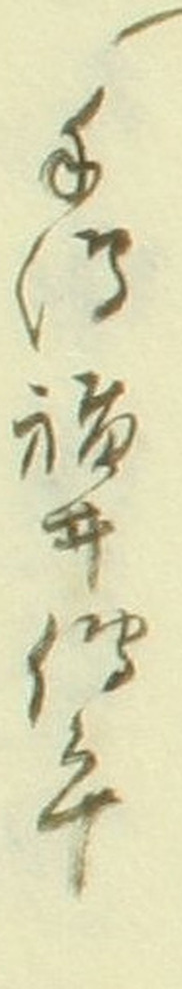手伝福井伝平
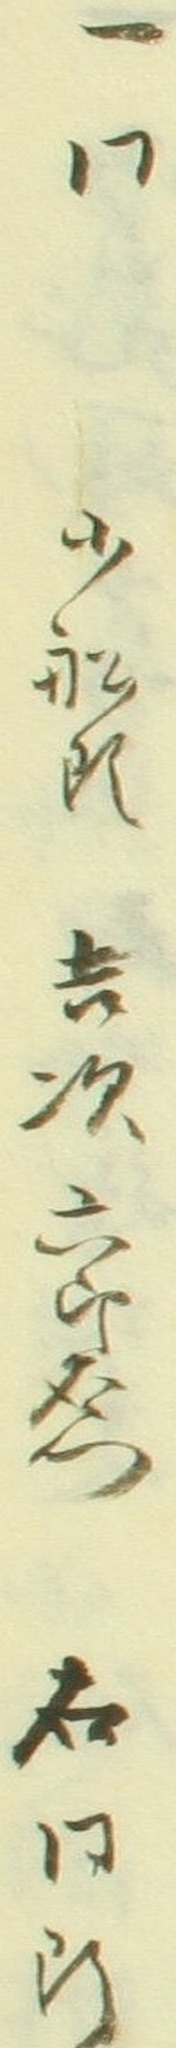一同小船頭吉次六郎右衛門右同断

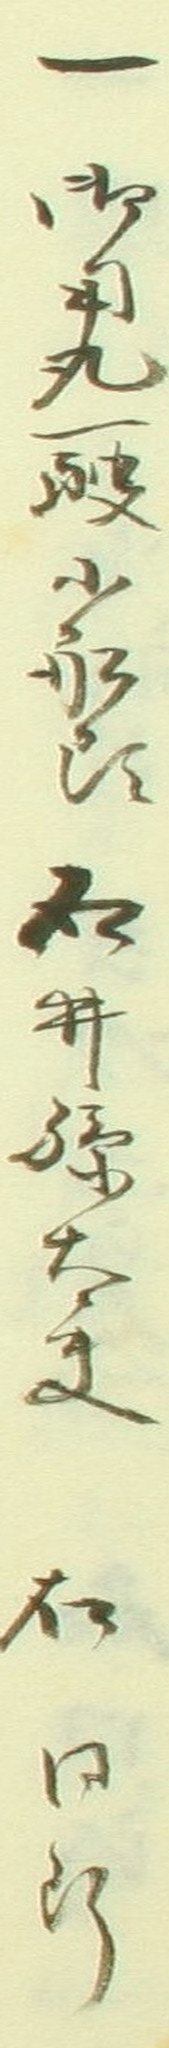一御用丸一艘小船頭石井孫太夫右同断
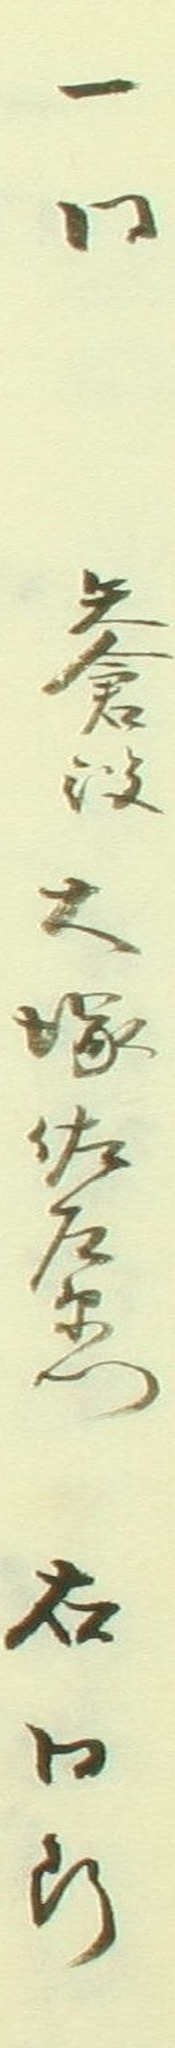一同矢倉役大塚佐左衛門右同断
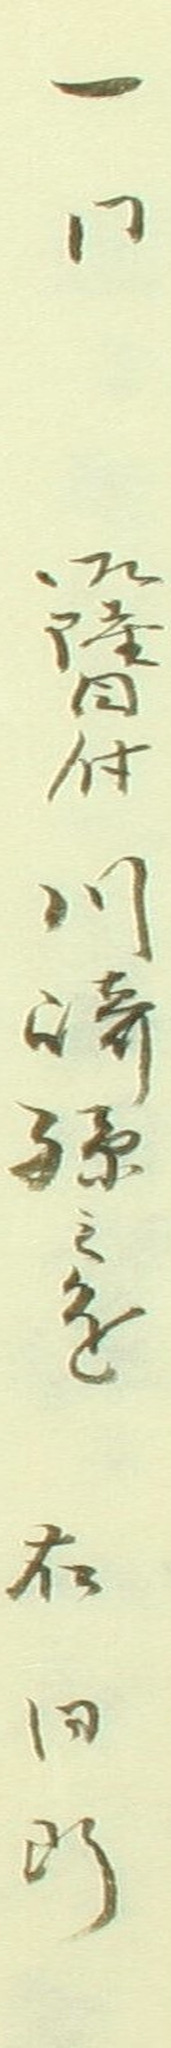一同御陸目付川崎孫之進右同断
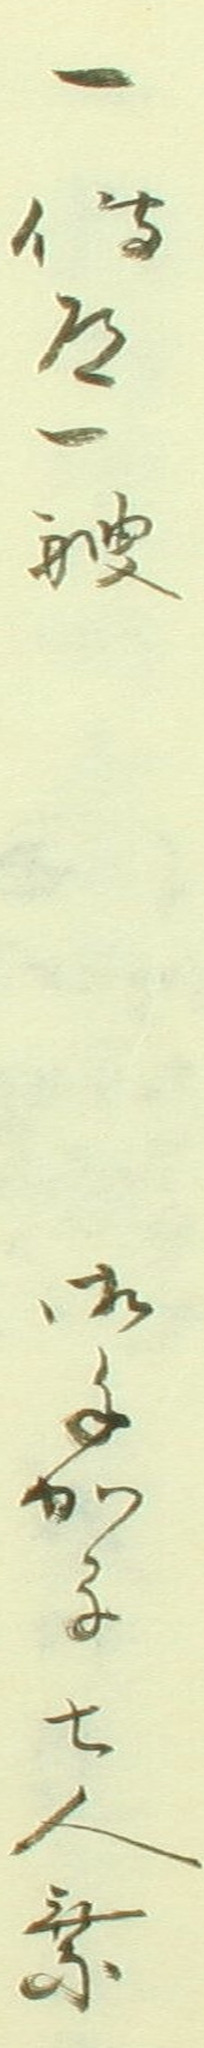一伝馬一艘御手加子七人乗
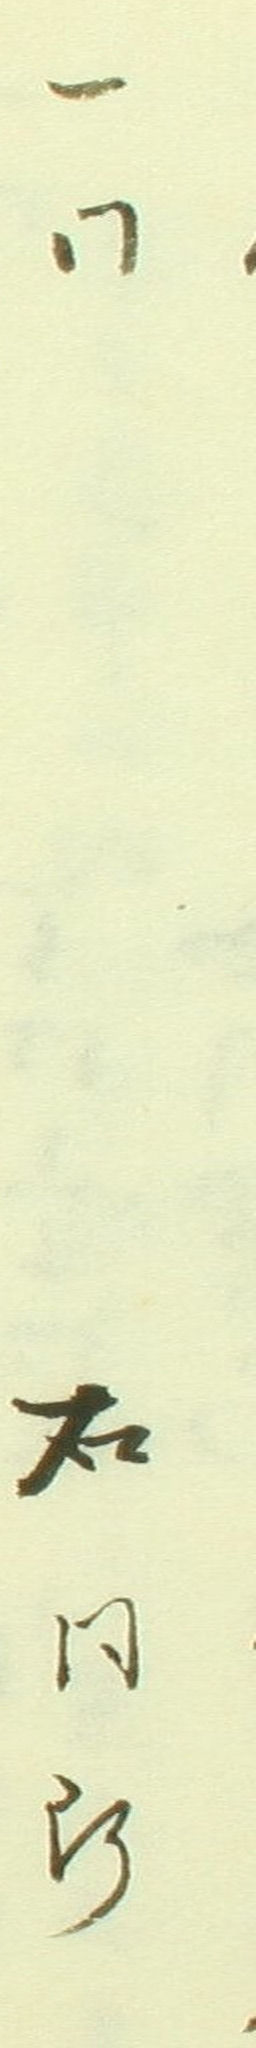一同右同断
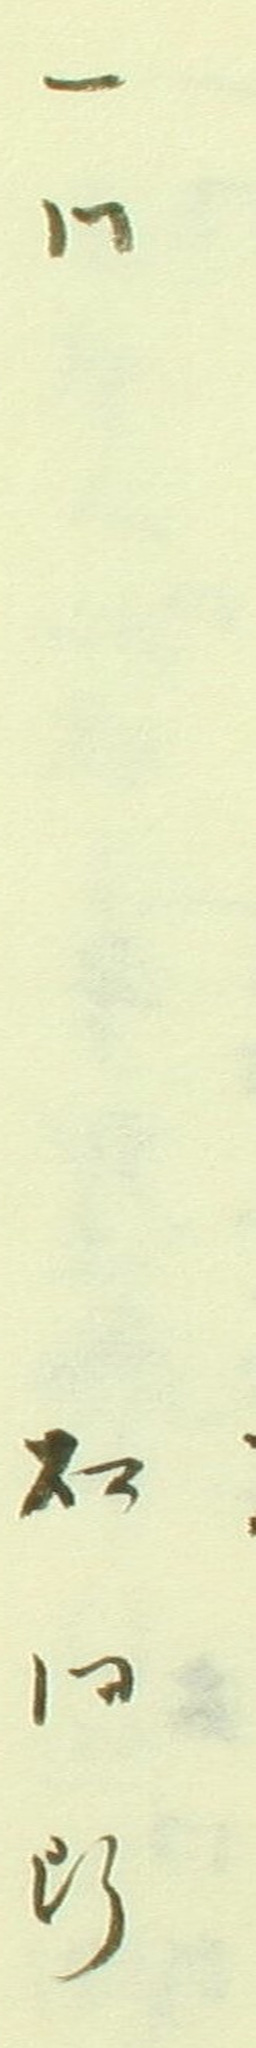一同右同断
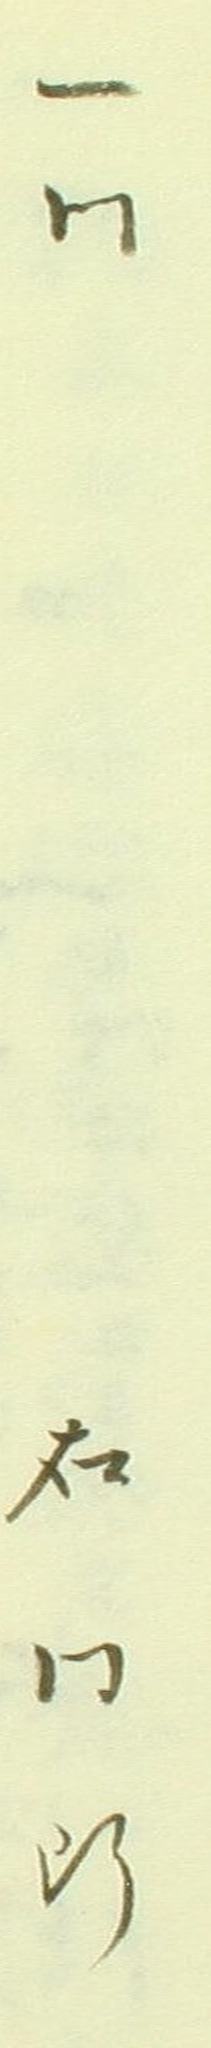一同右同断
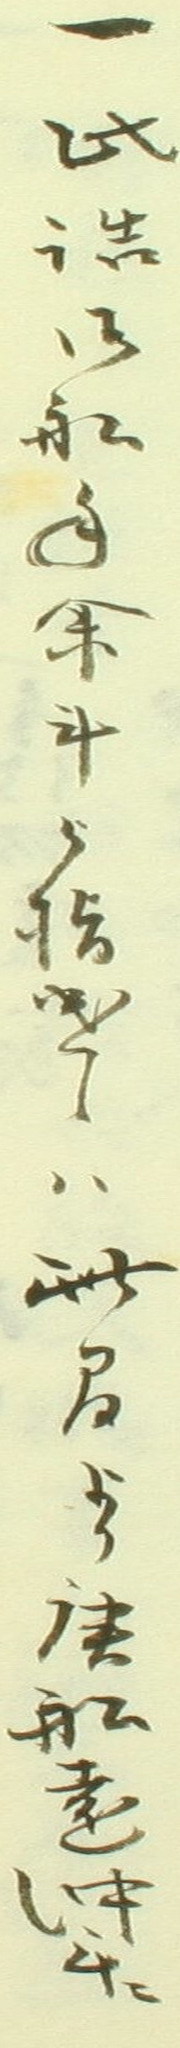一此詰御船手参斗被指遣候は此間より唐船遠沖斗に
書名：唐船漂流記 三
